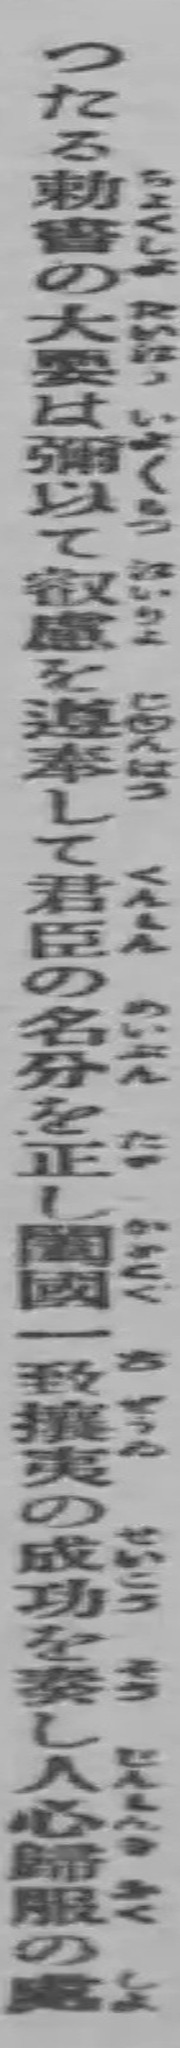つたる勅書の大要は弥以て叡慮を遵奉して君臣の名分を正し闔国一致攘夷の成功を奏し人心帰服の処
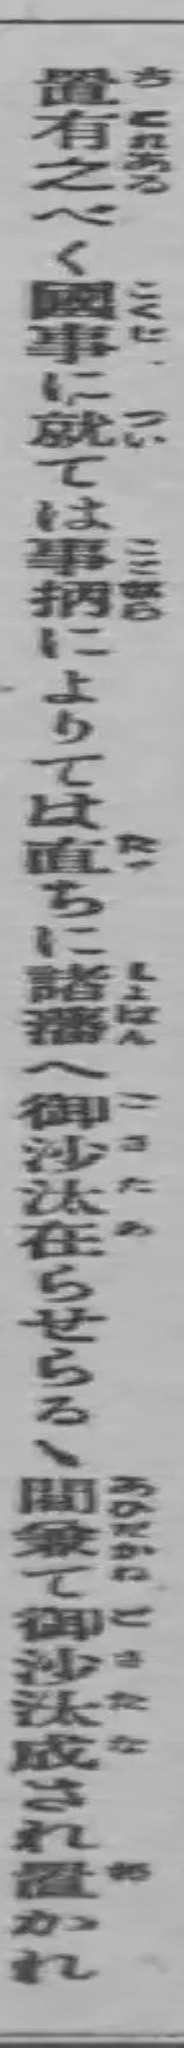置有之べく国事に就ては事柄によりては直ちに諸藩へ御沙汰在らせらるゝ間兼て御沙汰成され置かれ
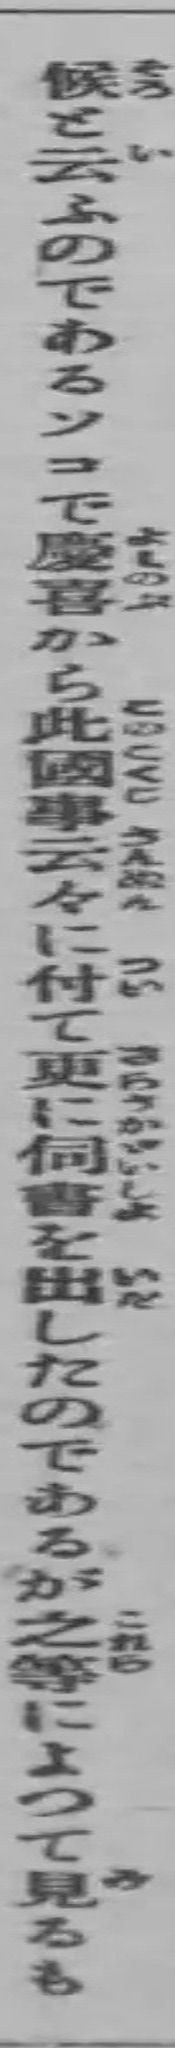候と云ふのであるソコで慶喜から此国事云々に付て更に伺書を出したのであるが之等によつて見るも
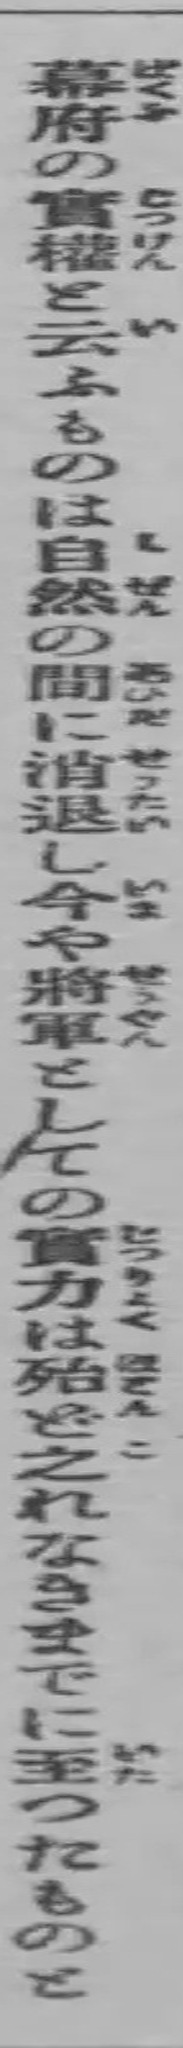幕府の実権と云ふものは自然の間に消退し今や将軍としての実力は殆ど之れなきまでに至つたものと
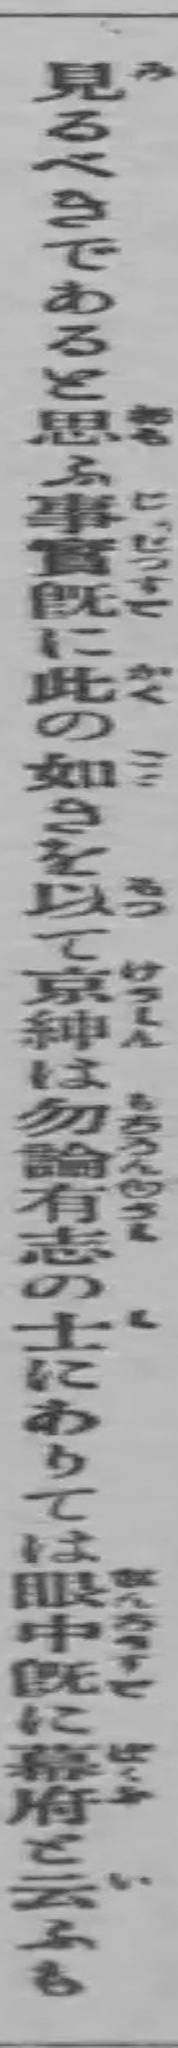見るべきであると思ふ事実既に此の如きを以て京神は勿論有志の士にありては眼中既に幕府と云ふも
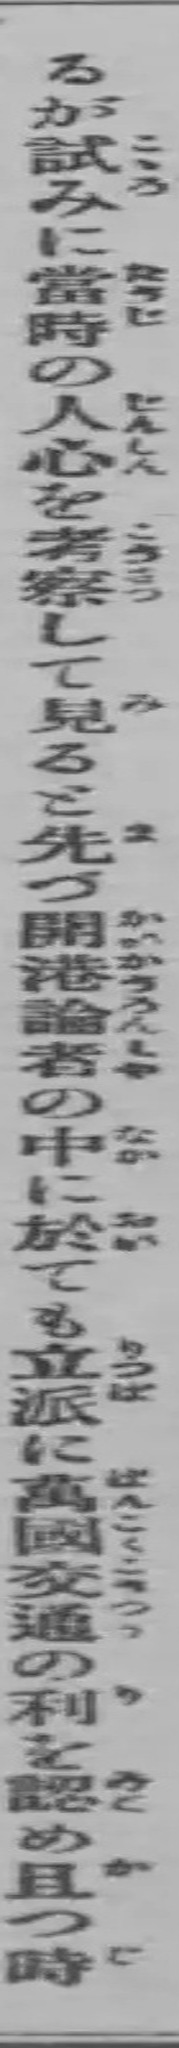るが試みに当時の人心を考察して見ると先づ開港論者の中に於ても立派に万国交通の利を認め且つ時
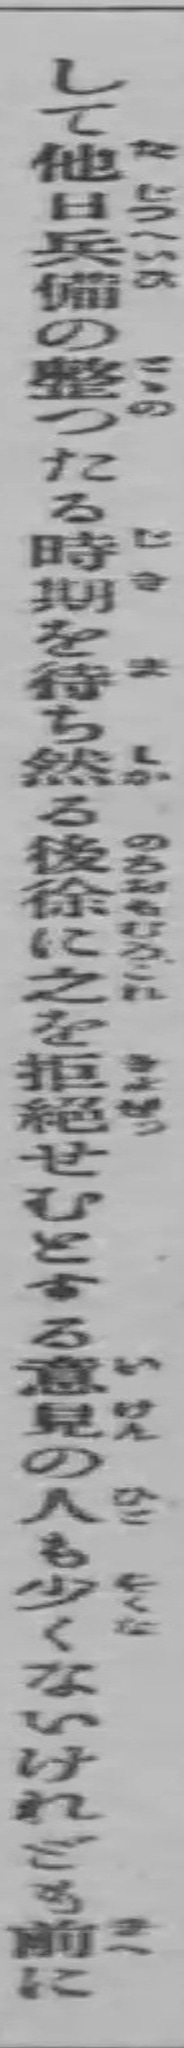して他日兵備の整つたる時期を待ち然る後徐に之を拒絶せむとする意見の人も少くないけれども前に
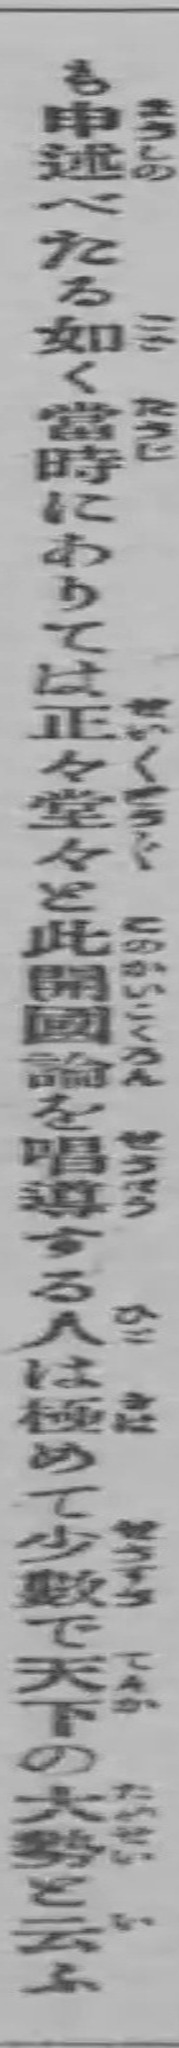も申述べたる如く当時にありては正々堂々と此開国論を唱導する人は極めて少数で天下の大勢と云ふ
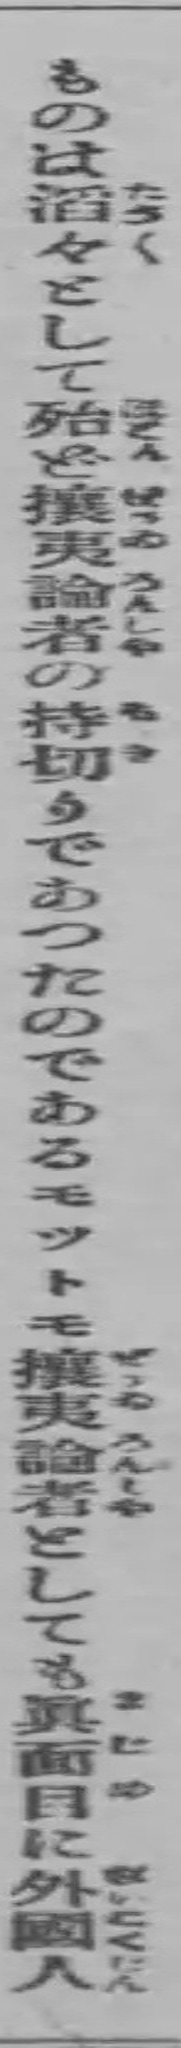ものは滔々として殆ど攘夷論者の持切りであつたのであるモツトモ攘夷論者としても真面目に外国人
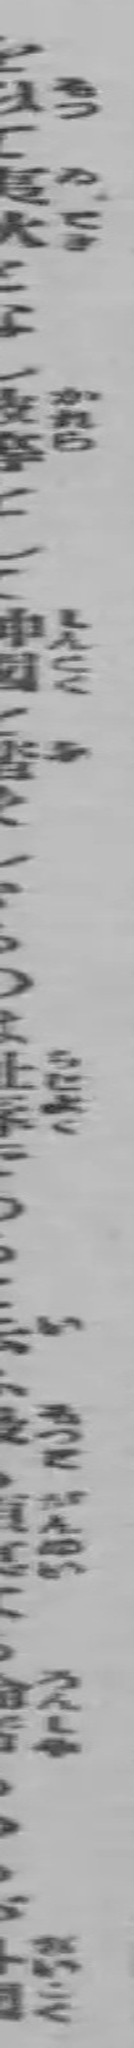を以て夷狄となし彼等をして神国を踏ましむるのは恥辱であると云ふ最も頑冥なる論者もあるが外国
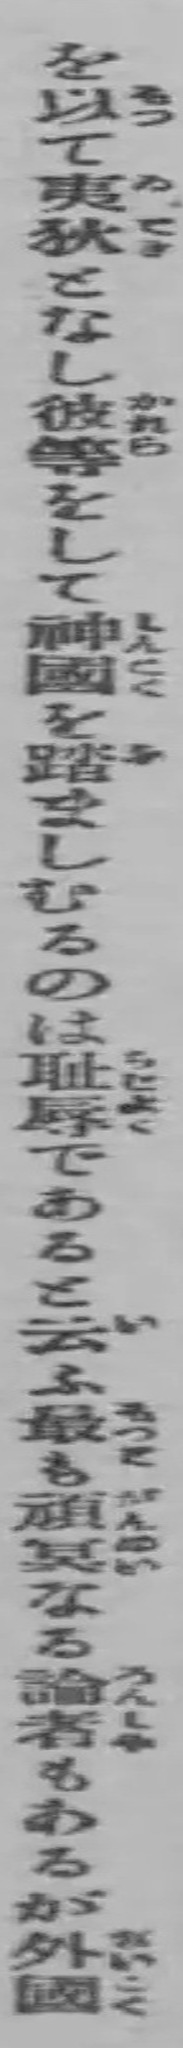を以て夷狄となし彼等をして神国を踏ましむるのは恥辱であると云ふ最も頑冥なる論者もあるが外国
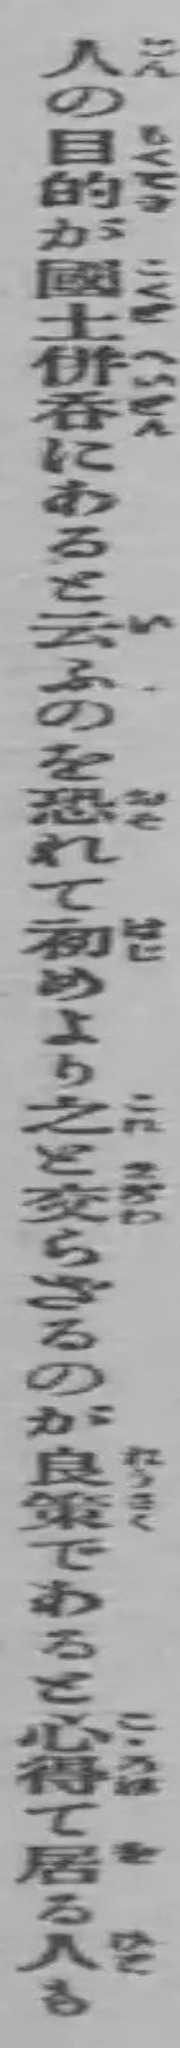人の目的が国土併呑にあると云ふのを恐れて初めより之と交らざるのが良策であると心得て居る人も

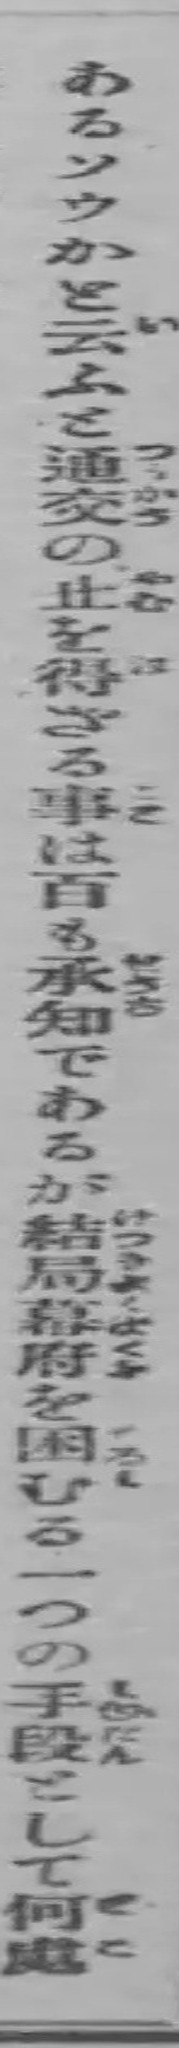あるソウかと云ふと交通の止を得ざる事は百も承知であるが結局幕府を困むる一つの手段として何処
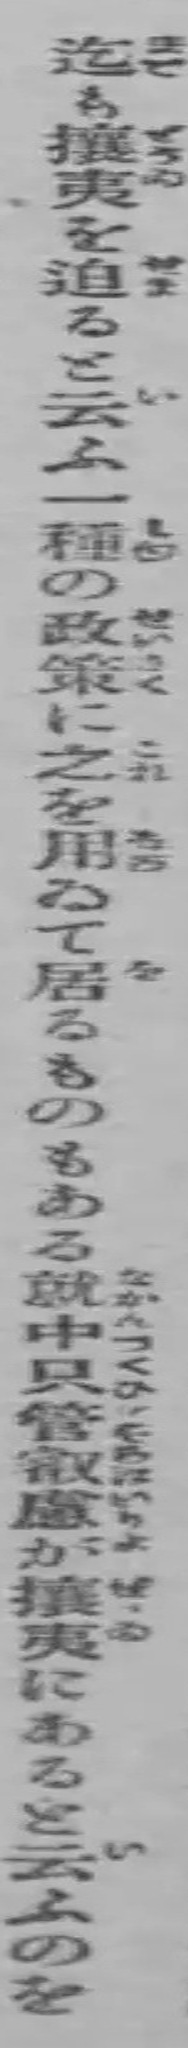迄も攘夷を迫ると云ふ一種の政策に之を用ゐて居るものもある就中只管叡慮が攘夷にあると云ふのを
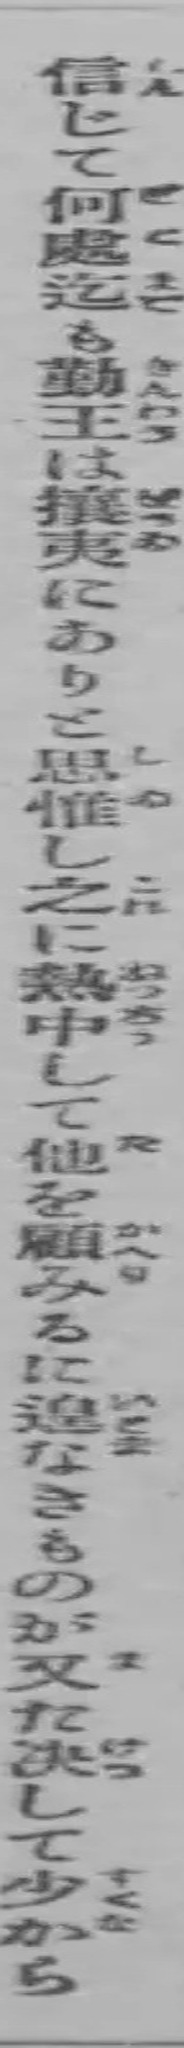信じて何処迄も勤王は攘夷にありと思惟し之に熱中して他を顧みるに遑なきものが又た決して少から
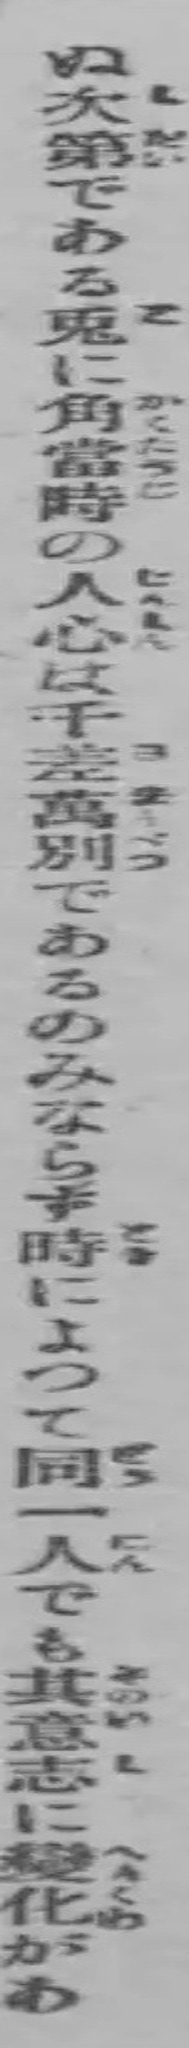ぬ次第である兎に角当時の人心は千差万別であるのみならず時によつて同一人でも其意志に変化があ
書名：豊橋市史談
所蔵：国立国会図書館 National Diet Library, JAPAN
